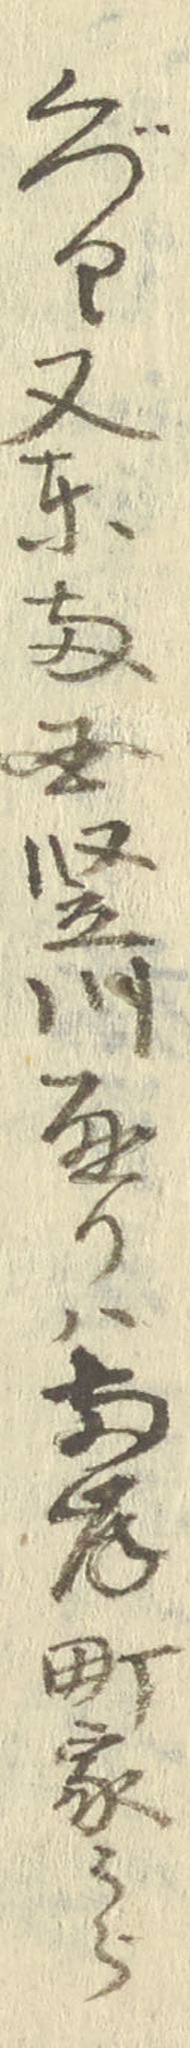くずるゝ又東両国竪川通りハ両岸町家から
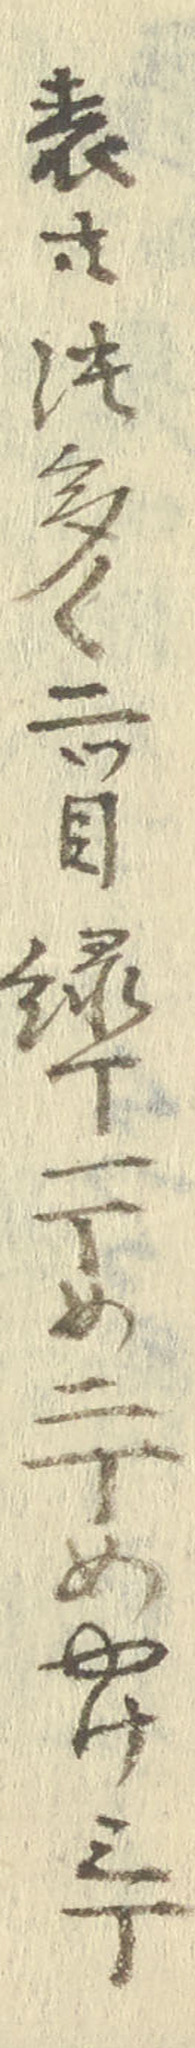表は潰多く二ツ目緑丁一丁め二丁めやけ三丁
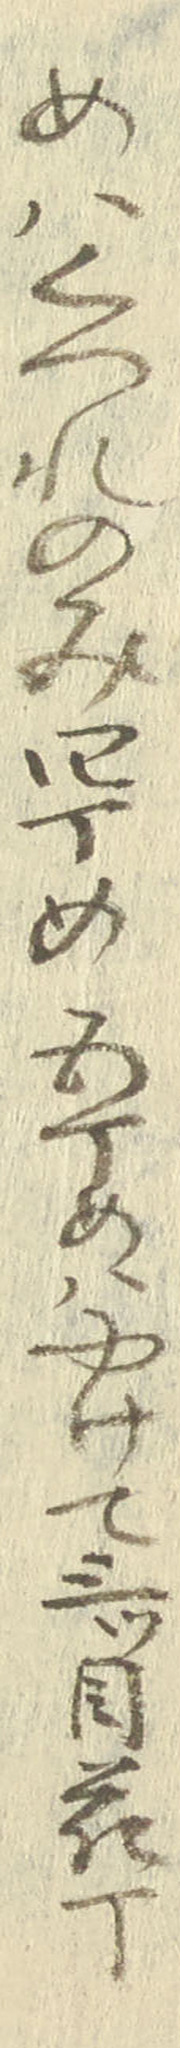めハくつれのみ四丁め五丁めハやけて三ツ目花丁
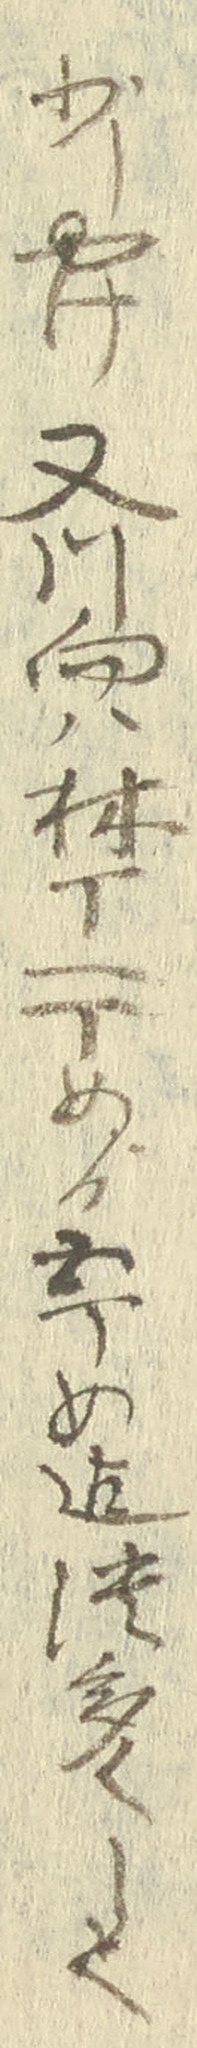少しやけ又川向ハ林丁一丁めゟ五丁めまで潰多くして
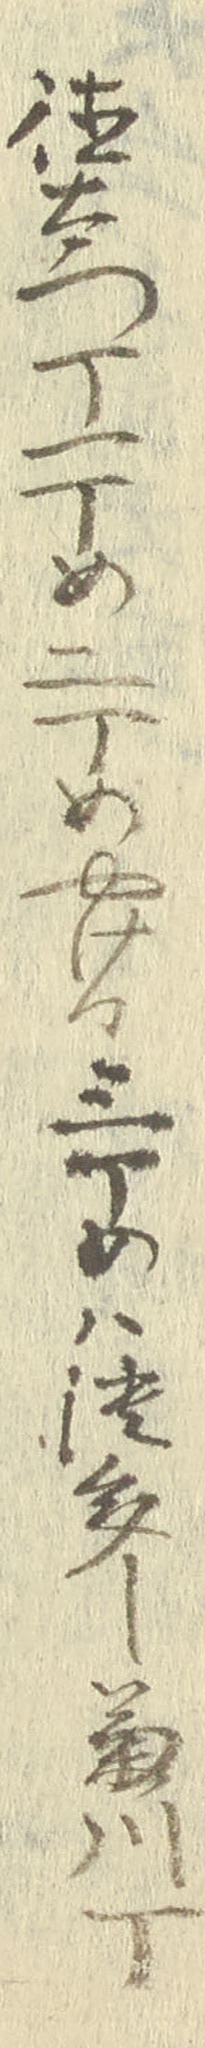徳右衛門丁一丁め二丁めやける三丁めハ潰多し菊川丁
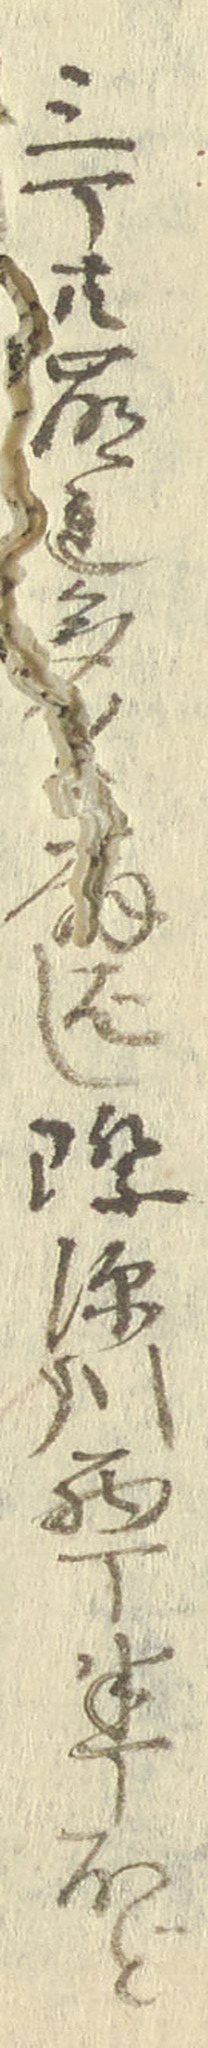三丁とも崩れ多く扇ばし際深川西丁半丁ほど
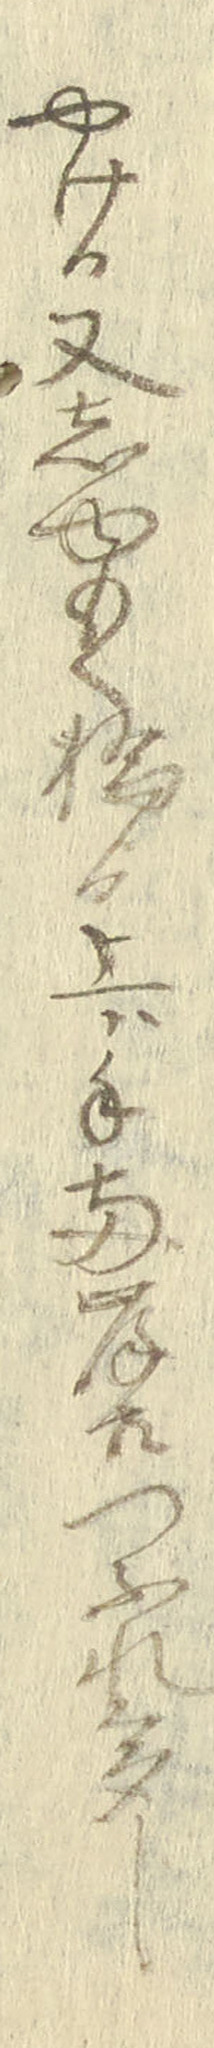やける又しゆもく橋ゟ上ハ手両岸共つふれ多し
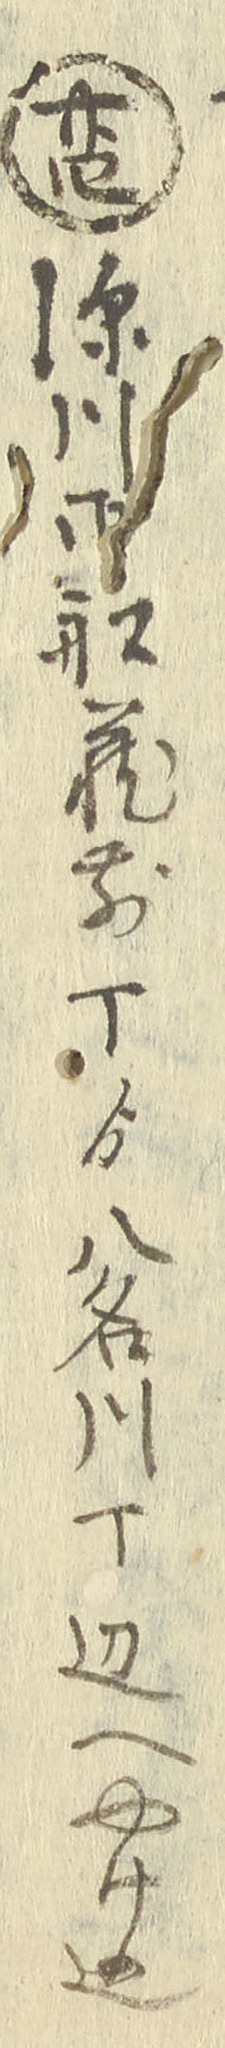廿四深川御船蔵前丁ゟ八名川丁辺へやけ込
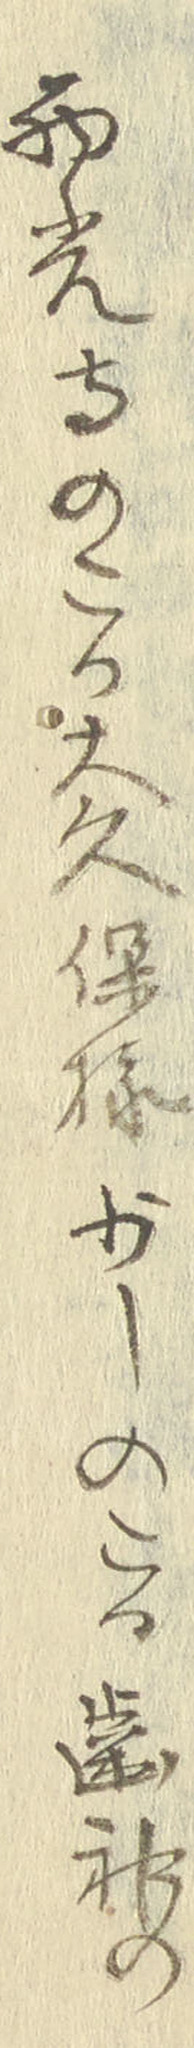西光寺のこる大久保様少しのこる歯神の
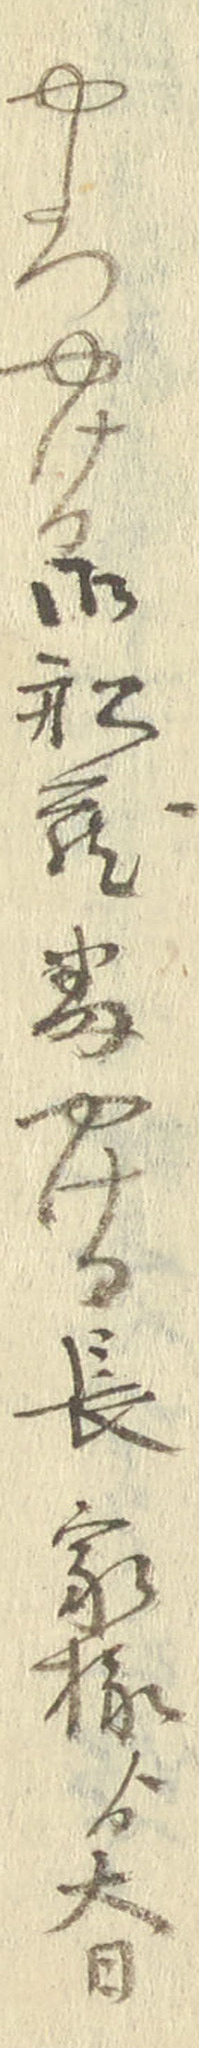やしろやける御船蔵番やける長家様ゟ大日
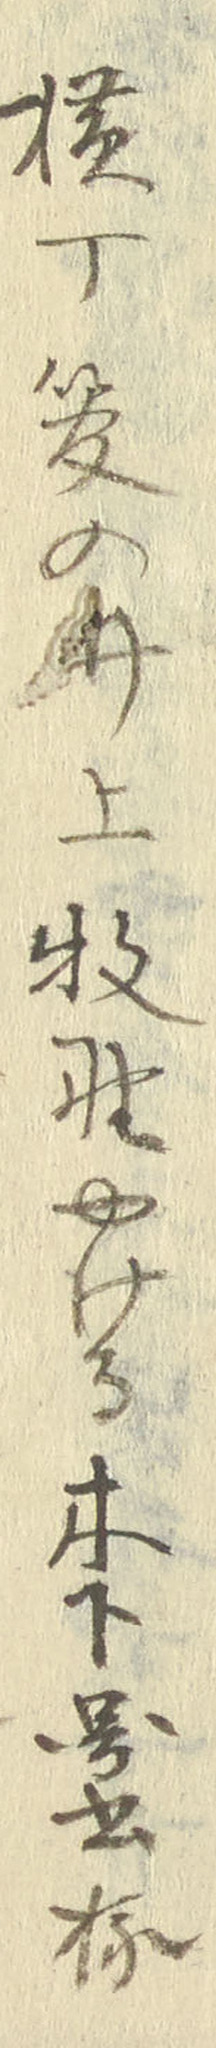横丁管の井上牧野やける木下圖書様
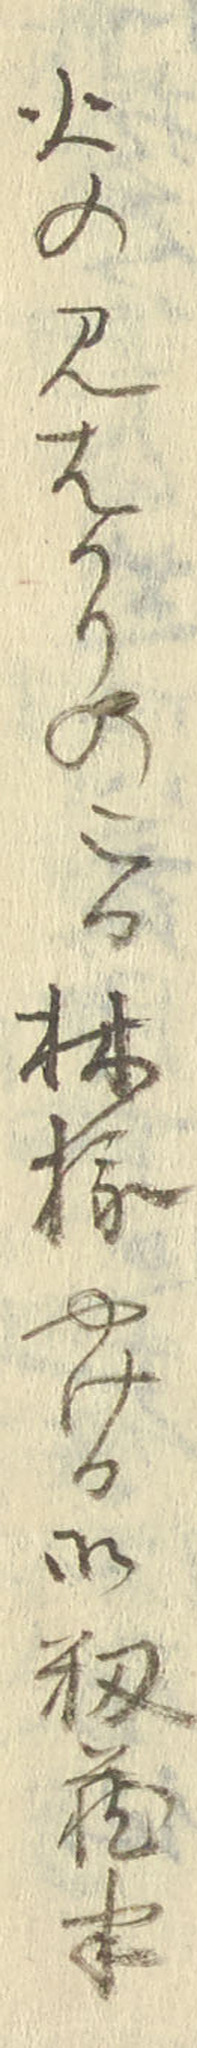火の見はかりのこる林様やける御籾蔵半

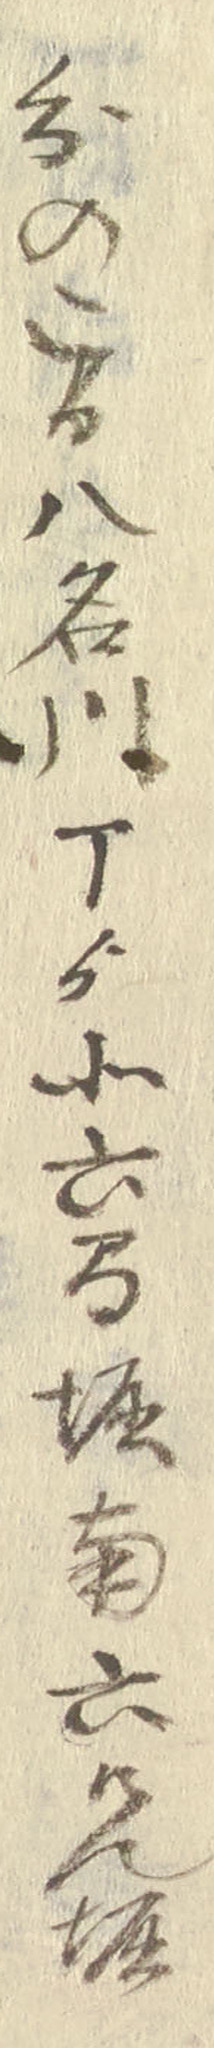分のこる八名川丁ゟ北六間堀南六けん堀
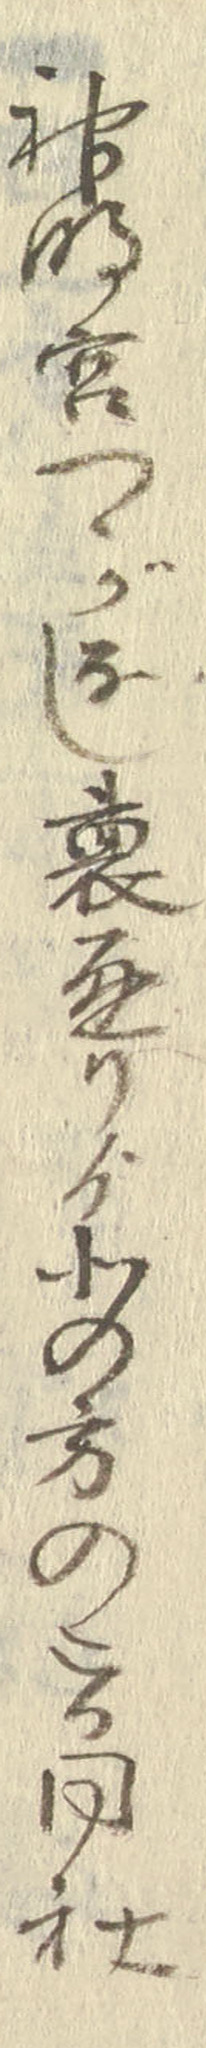神明宮つゝがなし裏通りゟ北の方のこる同社
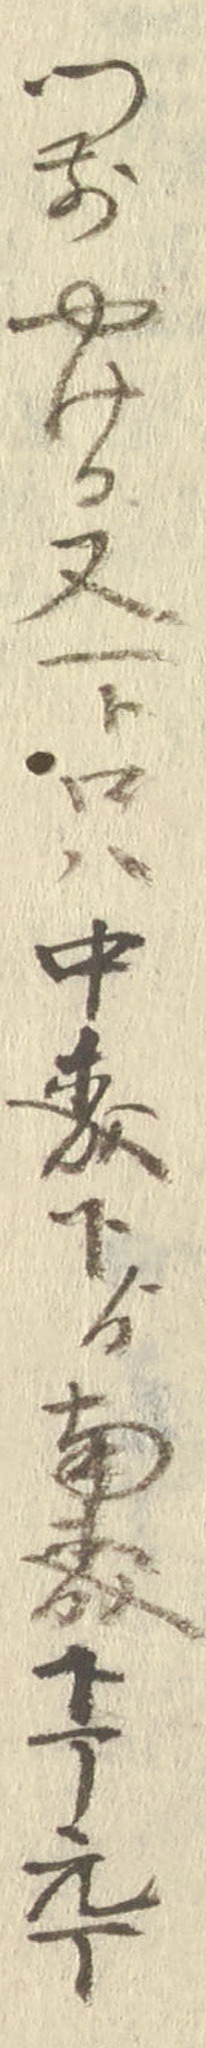門前やける又一ト口は中敷下ゟ南森下丁元丁
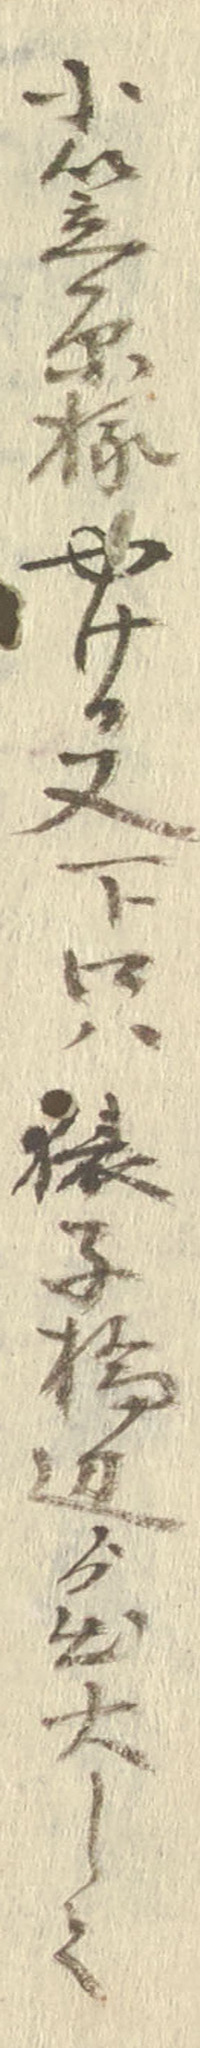小笠原様やける又一ト口は猿子橋辺ゟ出火して
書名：御府内御屋敷方市中共地震類焼場所明細書之冩兼街道筋近郷聞書
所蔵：東京大学総合図書館 General Library in the University of Tokyo, JAPAN
